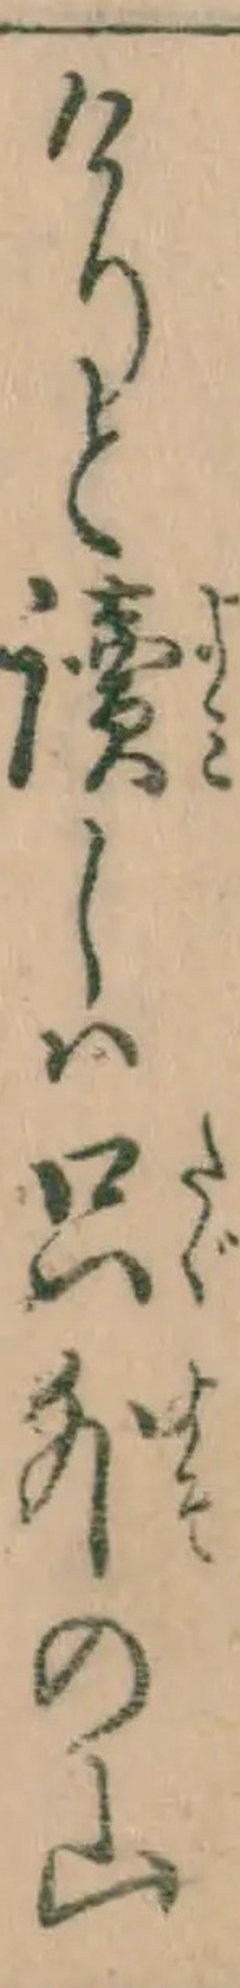けりと読しは只外の山
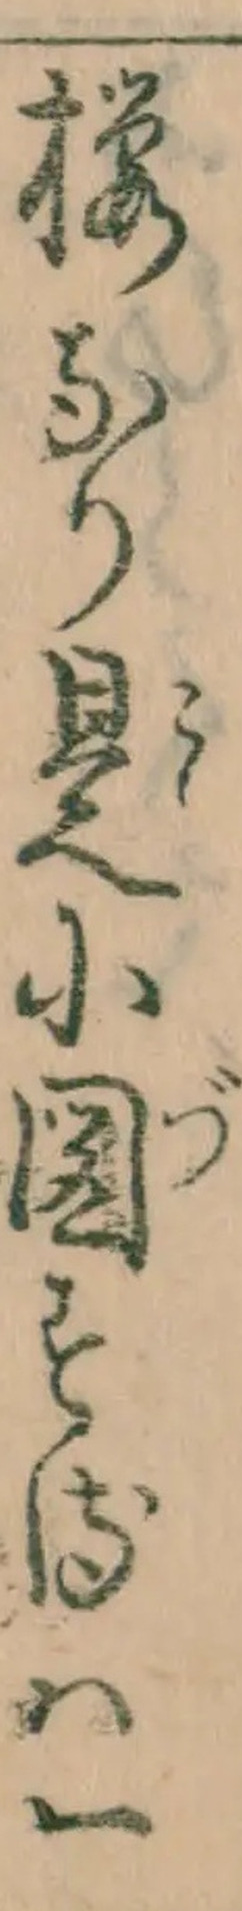桜なり是に図するは一
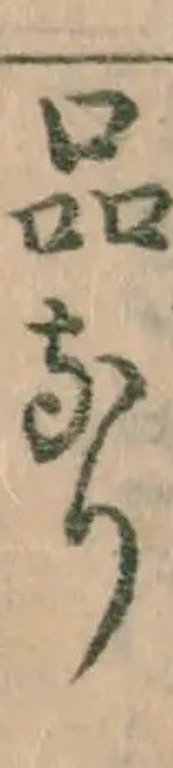品なり

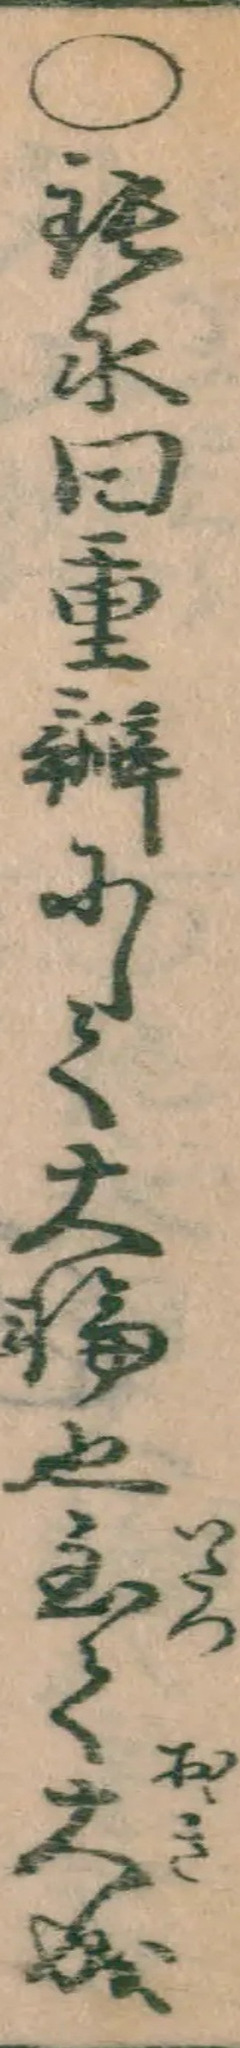○鈍永曰く重弁にして大輪也至て大成
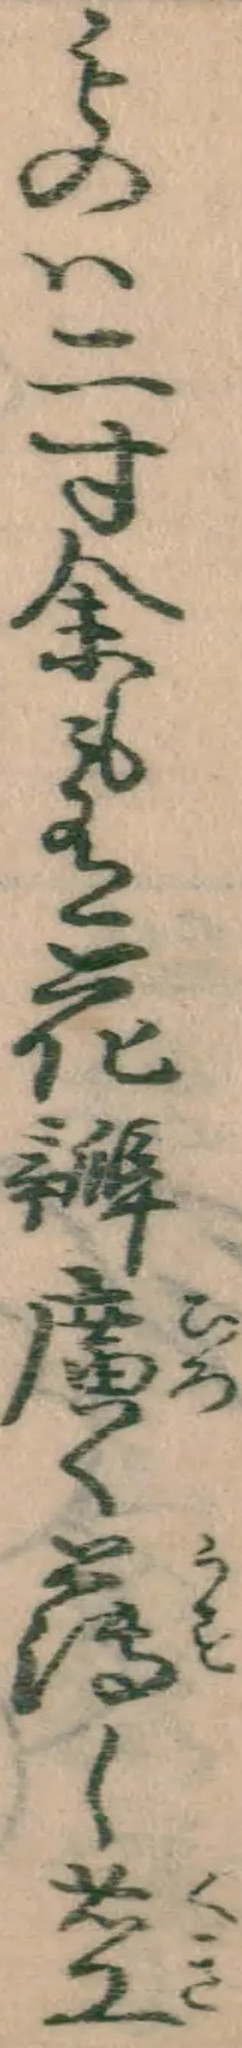ものは二寸余も有花弁広く薄し茎
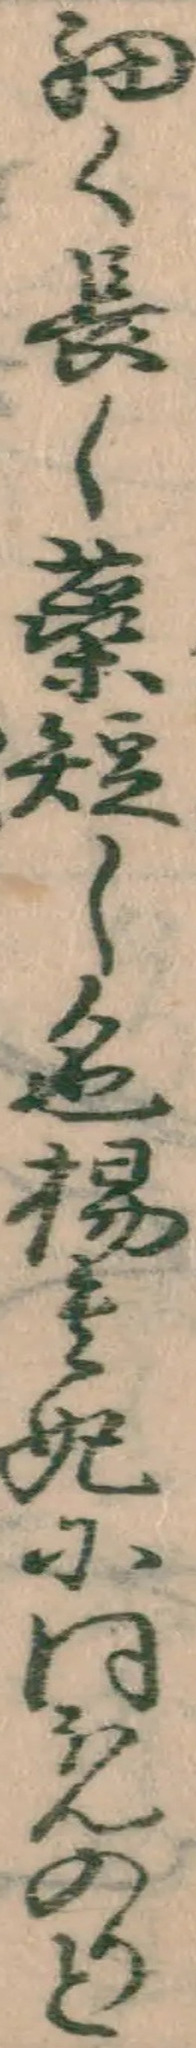細く長し蘂短し色楊貴妃に同ほんのりと
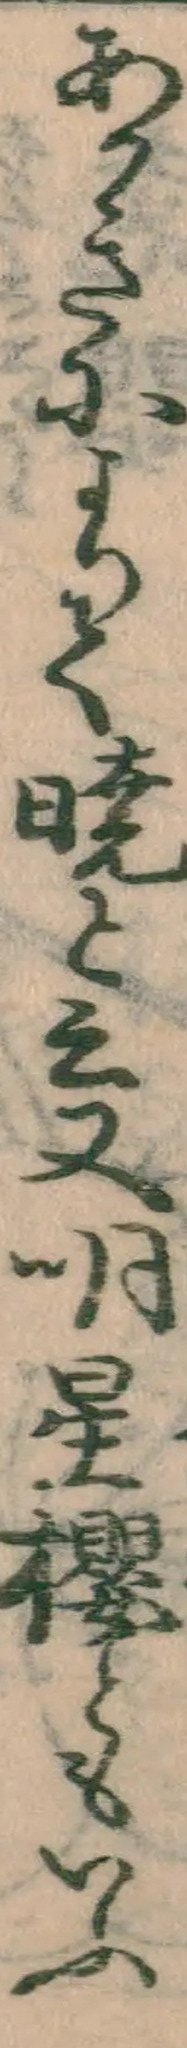あかきによりて暁と云又明星桜ともいふ
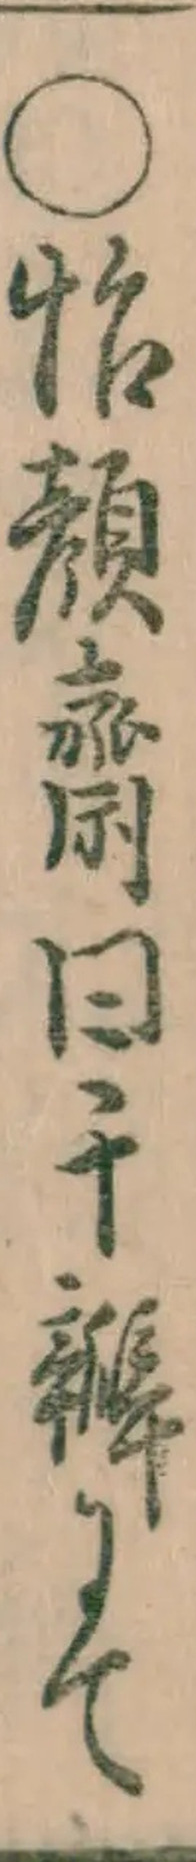○怡顔斎曰千弁にて
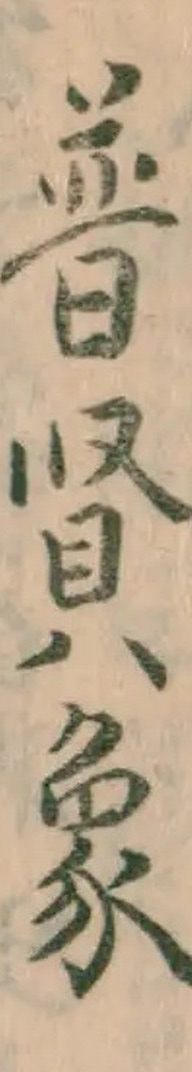普賢象
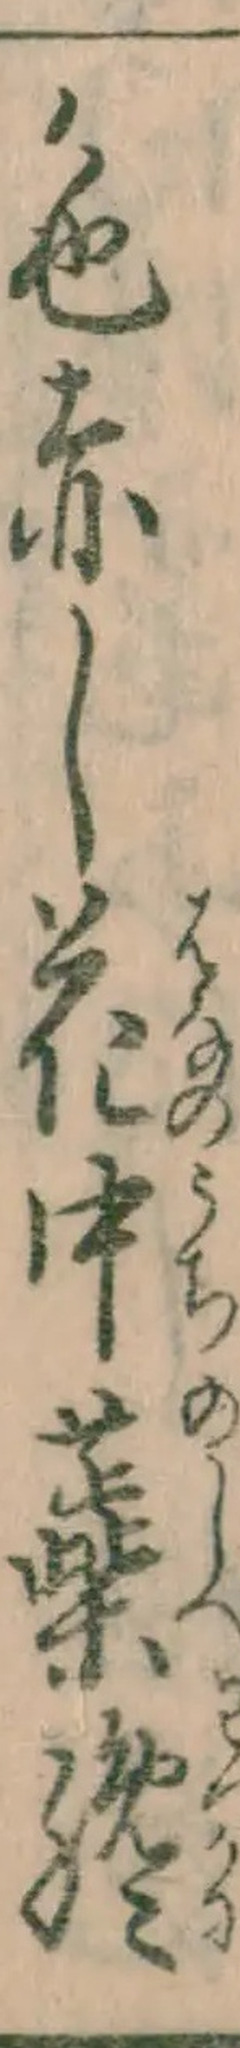色赤し花中蘂纔
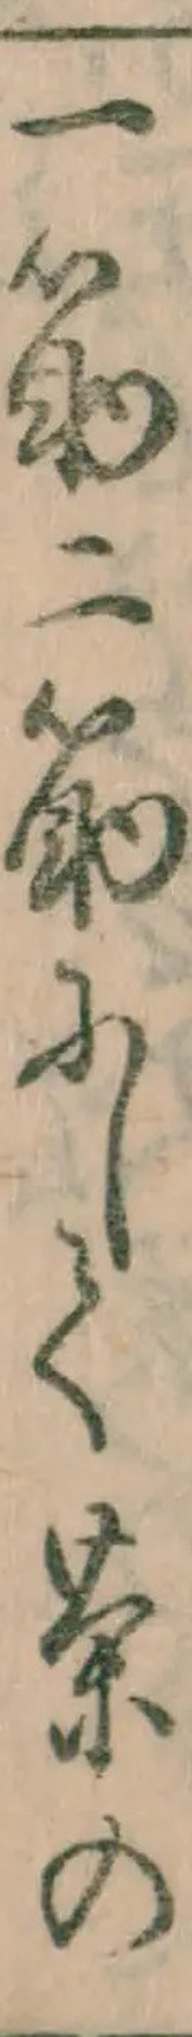一筋二筋にして茶の
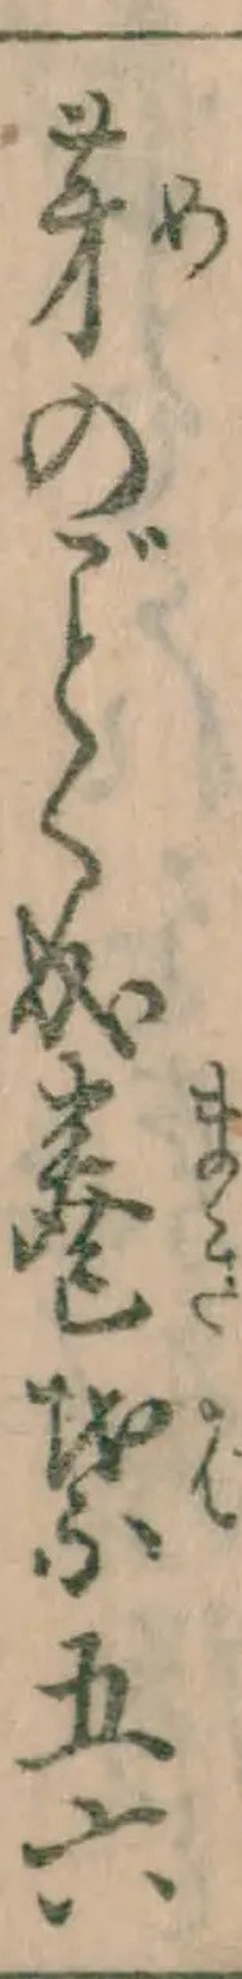芽のごとく成巻葉五六
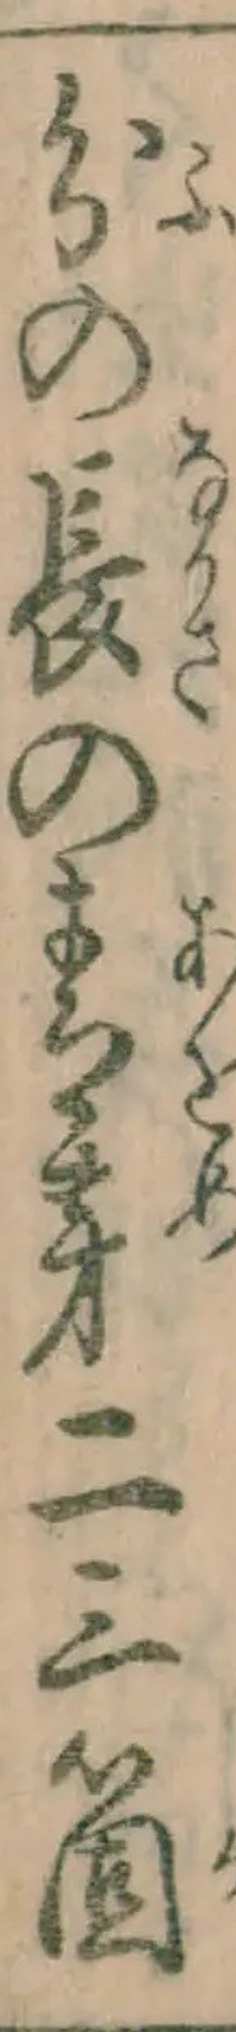分の長の青芽二三箇

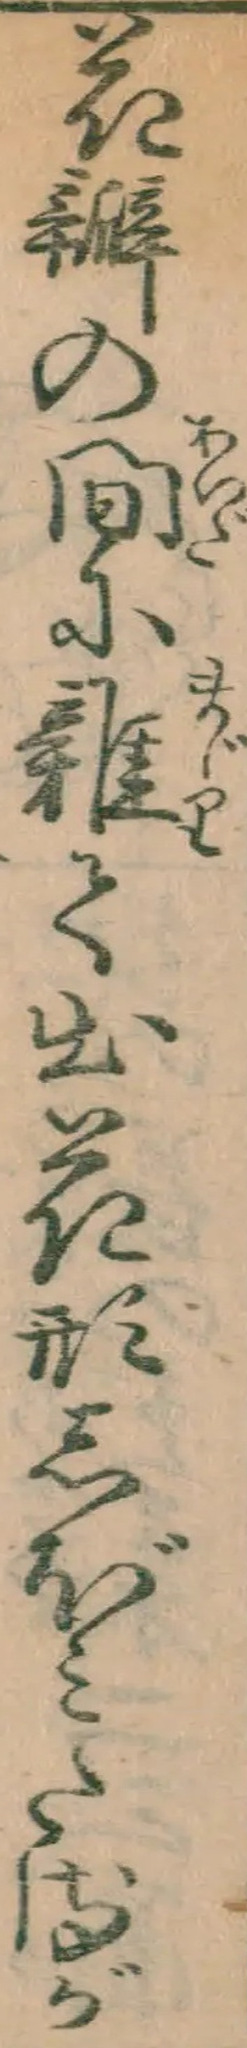花弁の間に雑て出花形しぼみたるが
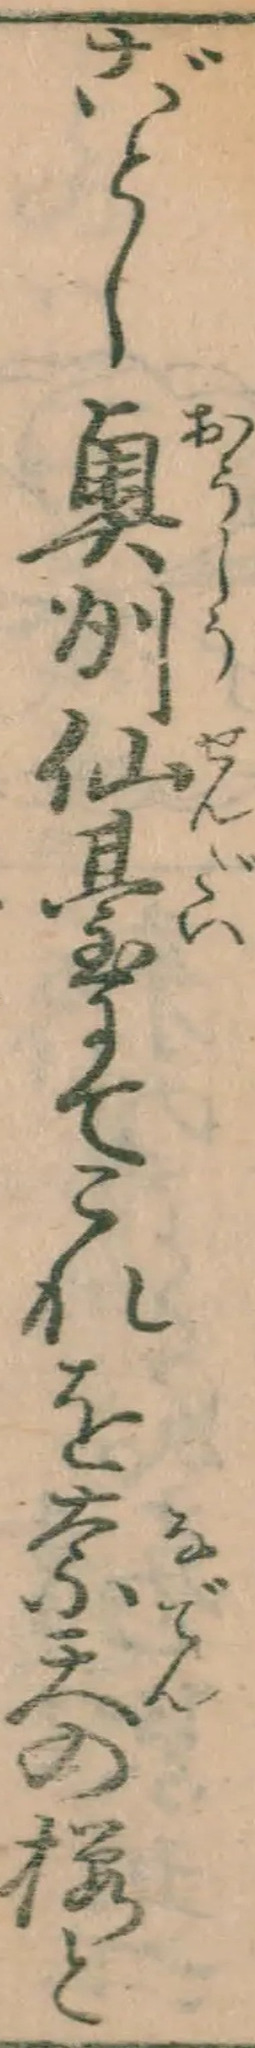ごとし奥州仙台にてこれを奈天の桜と
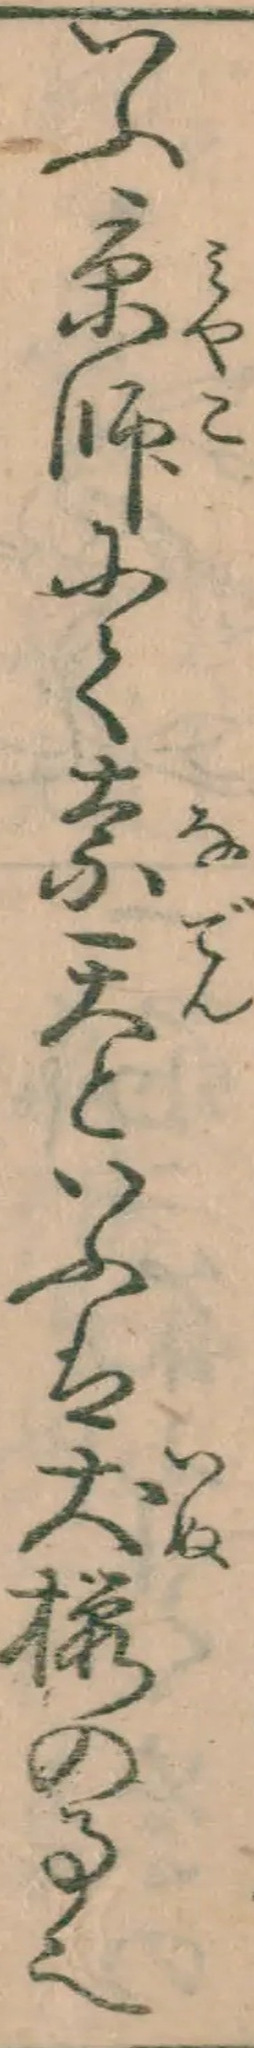いふ京師にて奈天といふは犬桜の事也
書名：怡顔齋櫻品
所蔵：国立国会図書館 National Diet Library, JAPAN
